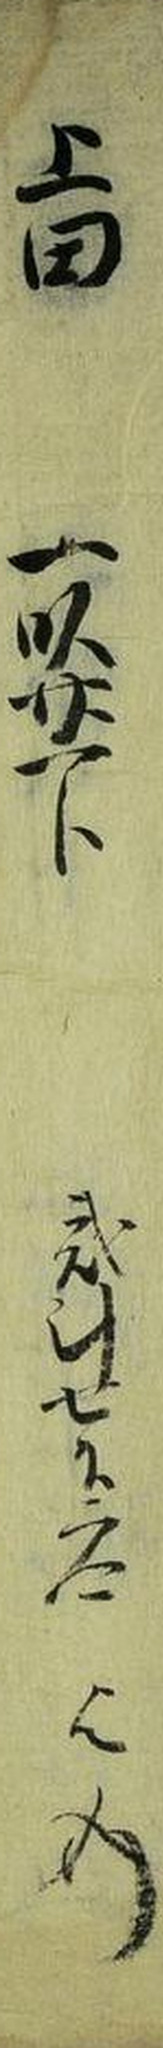上田一畝廿一歩弐斗七升二合与介
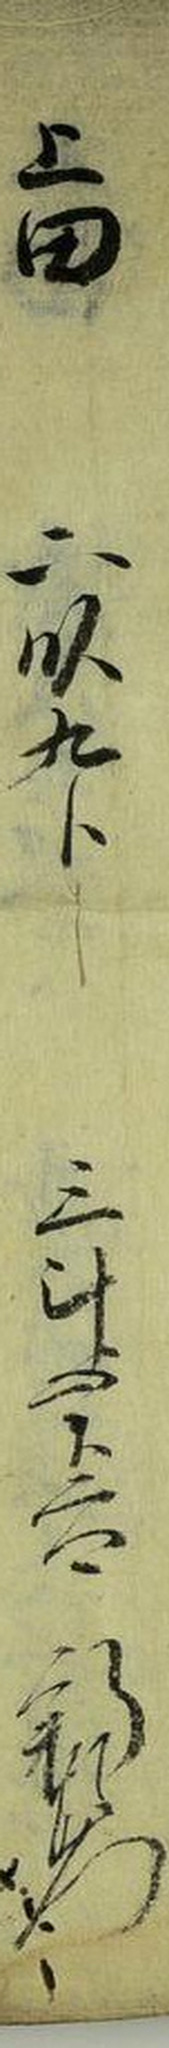上田二畝九歩三斗二升二合新左衛門
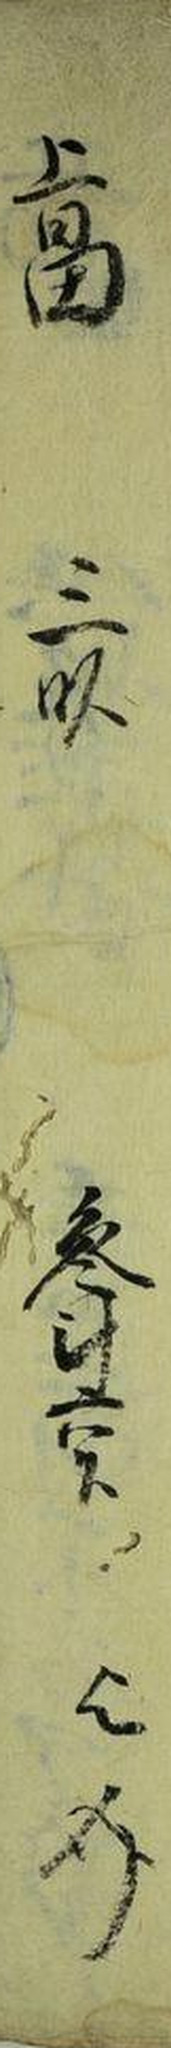上畠三畝参斗六升与介
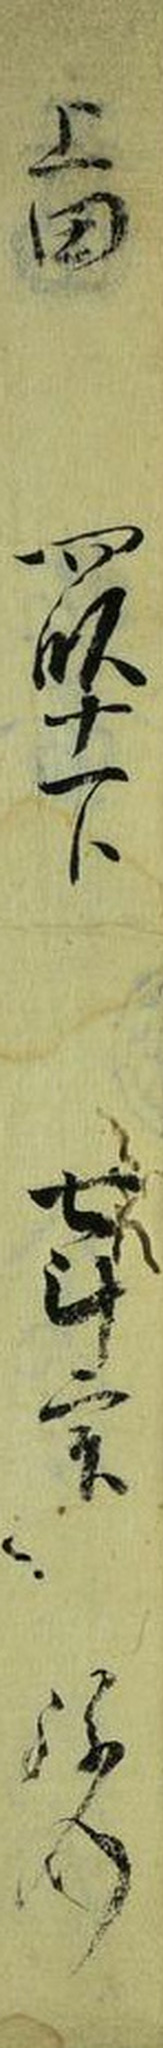上田四畝十一歩七斗二升弥介
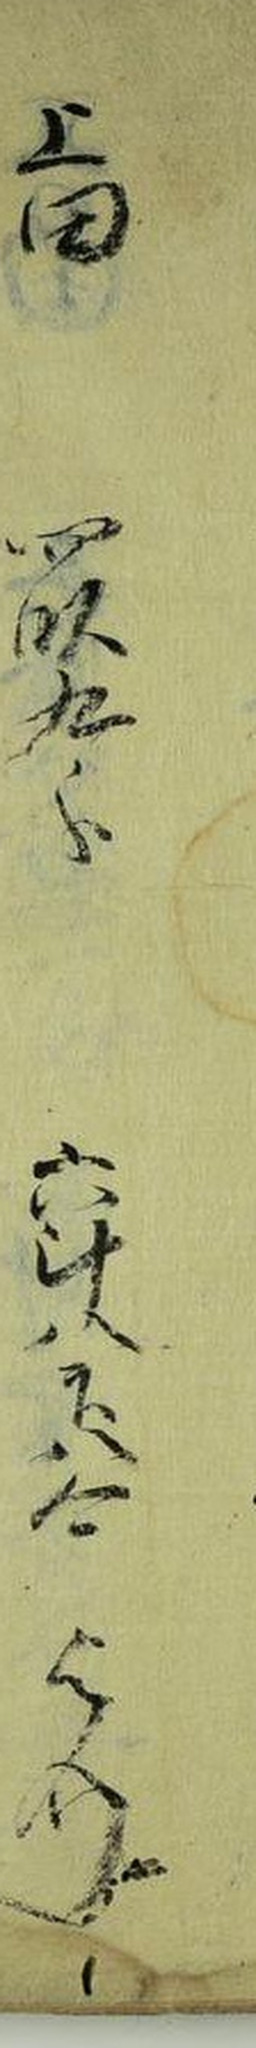上田四畝九歩六斗八升八合与介
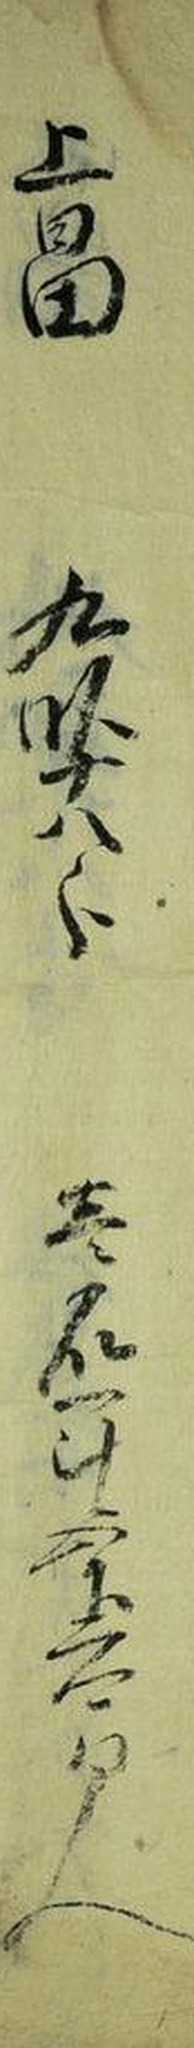上畠九畝十八歩壱石一斗五升二合同人
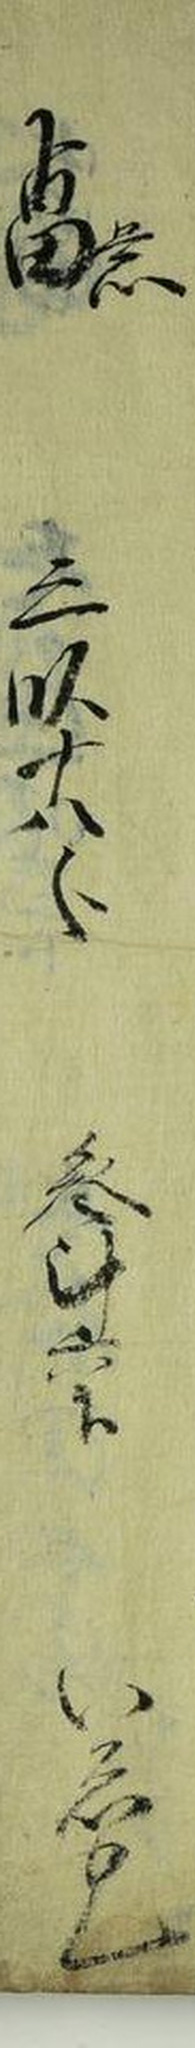上田三畝十八歩参斗六升い
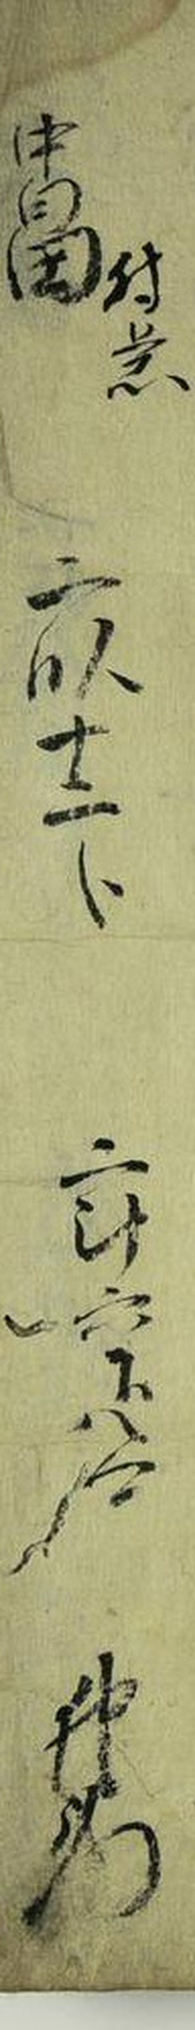中畠二畝十二歩二斗六升八合仲右衛門助

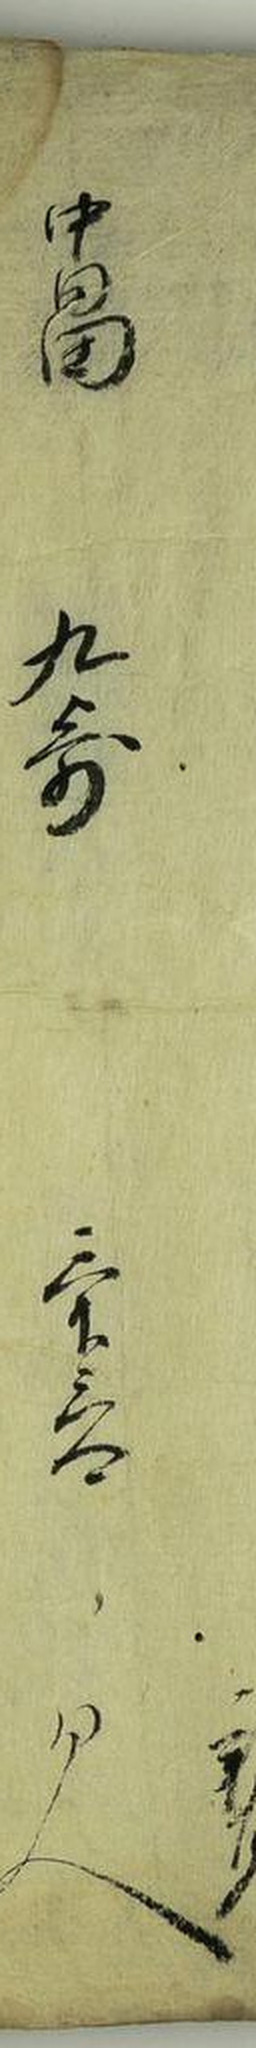中畠九歩三升三合同人
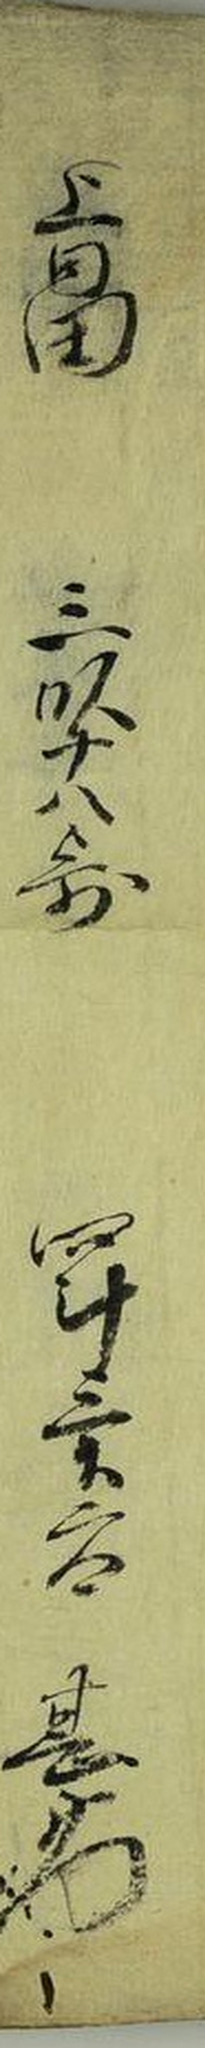上畠三畝十八歩四斗三升二合甚右衛門
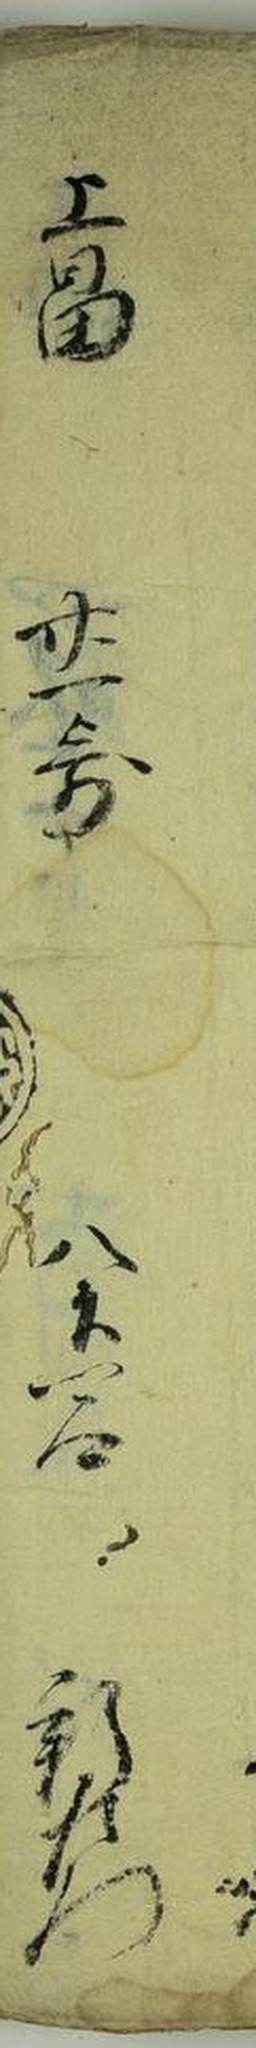上畠廿一歩八升四合新左衛門
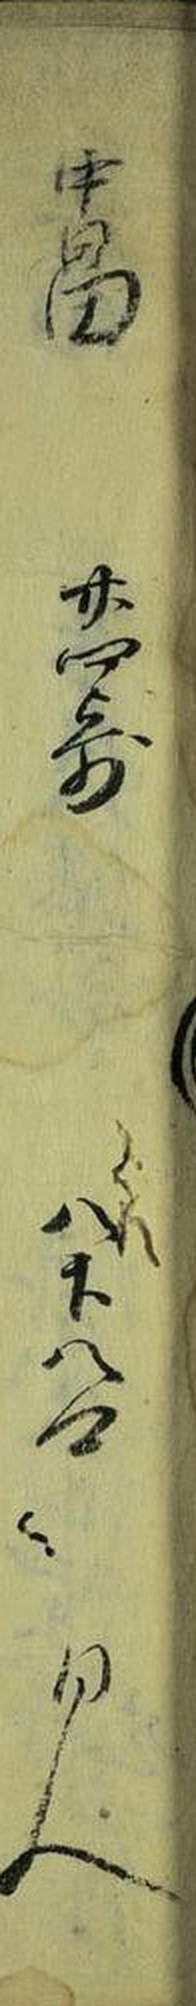中畠廿四歩八升八合同人
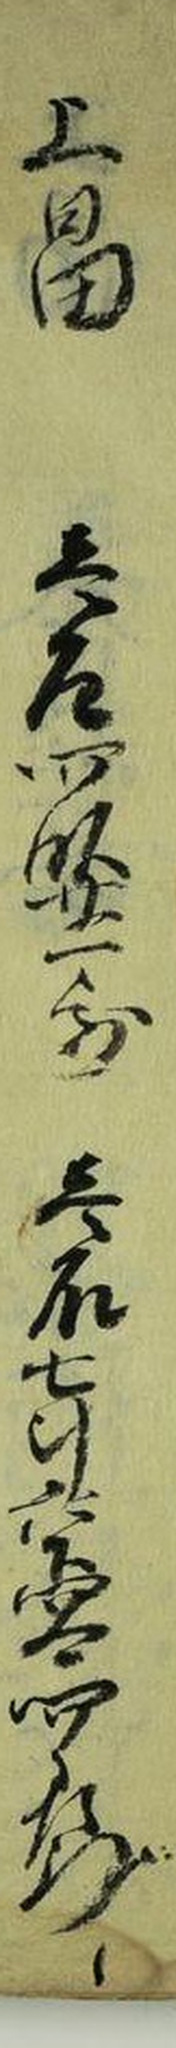上畠壱反四畝廿一歩壱石七斗六升四合四郎左衛門
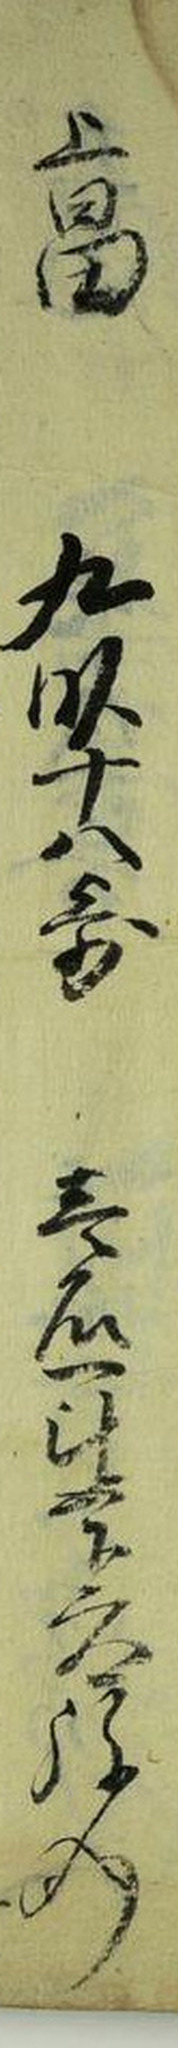上畠九畝十八歩壱石一斗五升二合弥介
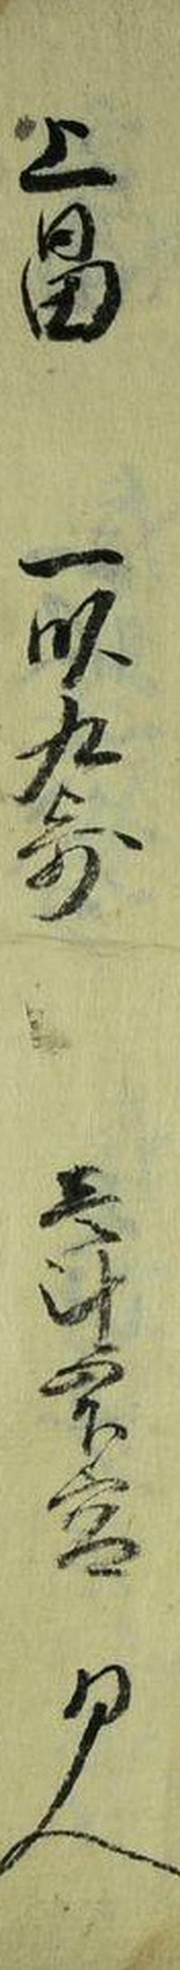上畠一畝九歩壱斗五升六合同人
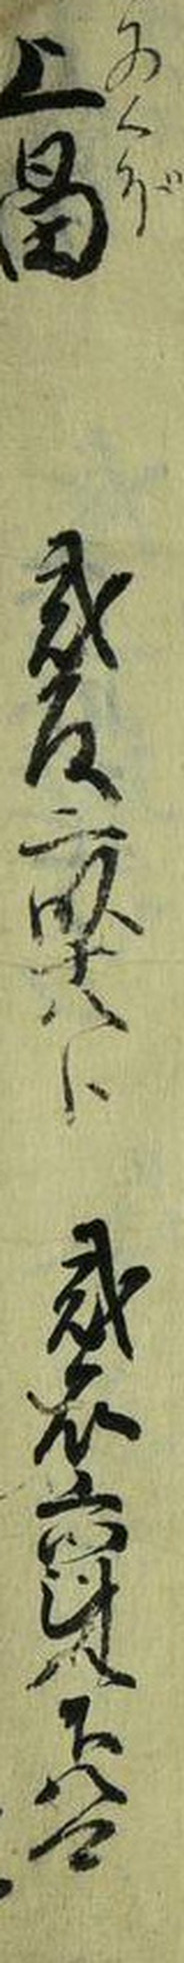上畠弐反弐畝十八歩弐石六斗八升八合弥介
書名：越前国中墨郡安沢村水帳（太閤検地帳）
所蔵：福井県文書館 Fukui Prefectural Archives
